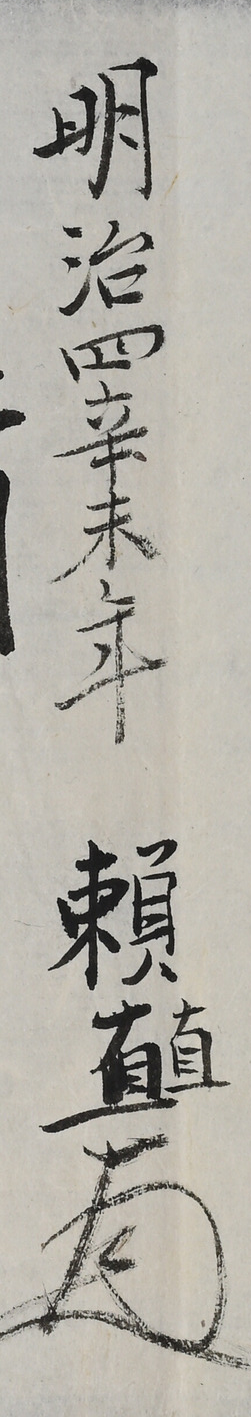明治四辛未年頼直花押
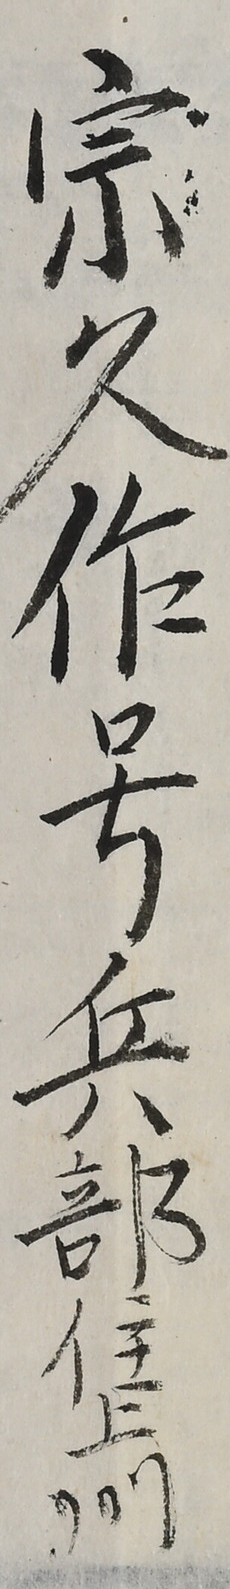宗久作号兵部住上州
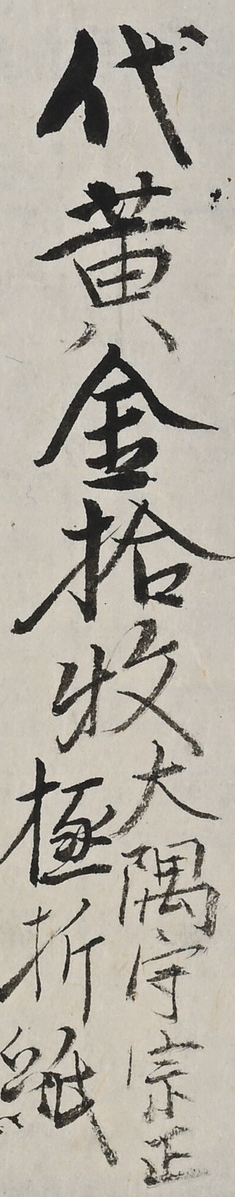代黄金拾枚大隅守宗正
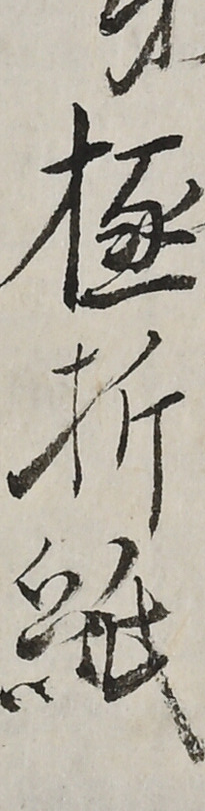極折紙
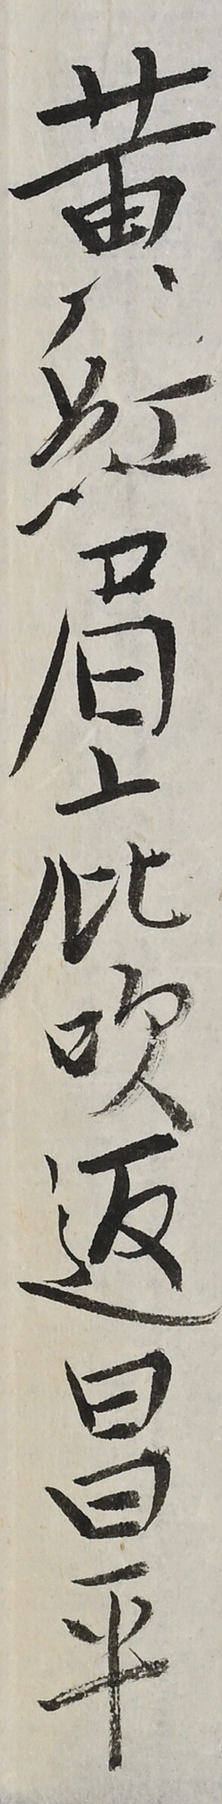黄紅眉庇吹返昌平
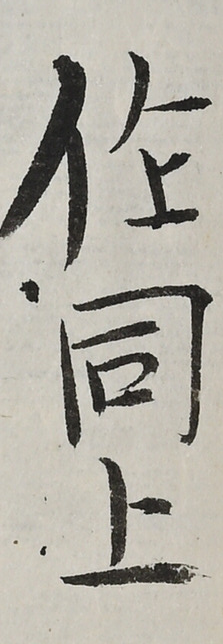作同上
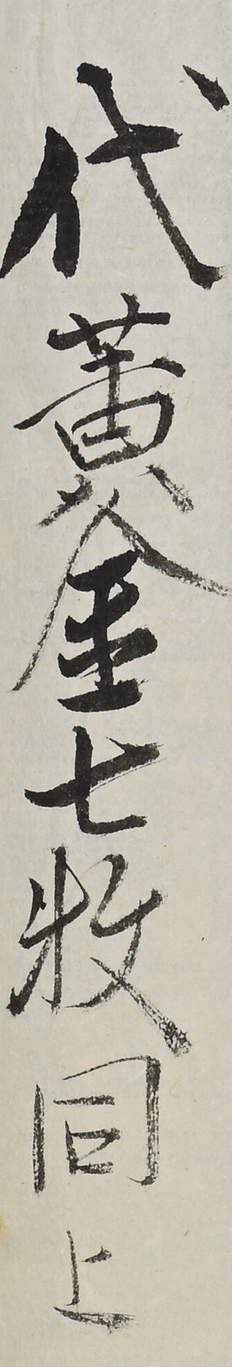代黄金七枚同上
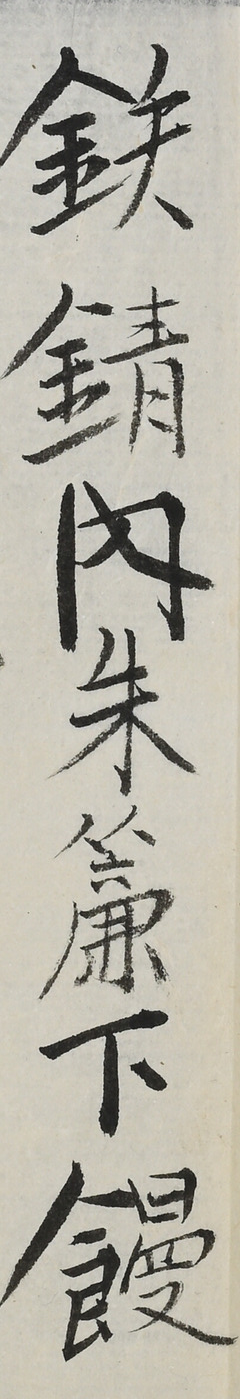鉄錆内朱簾下饅
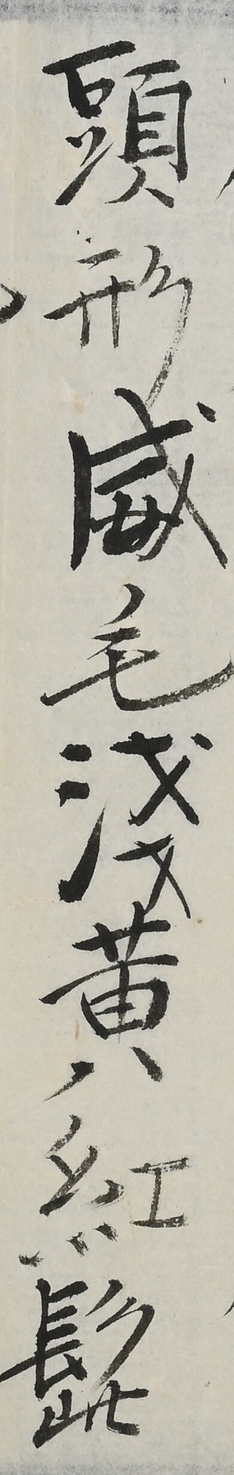頭形威毛浅黄紅髭
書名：記
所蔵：伊那市立高遠町図書館・合同会社AMANE
